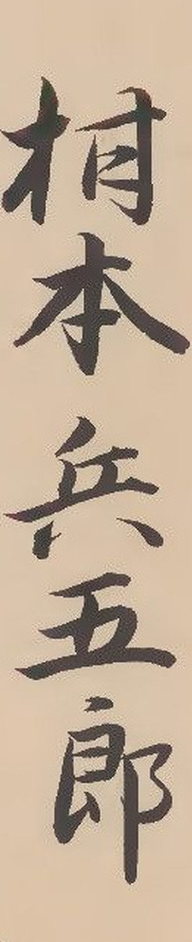柑本兵五郎
